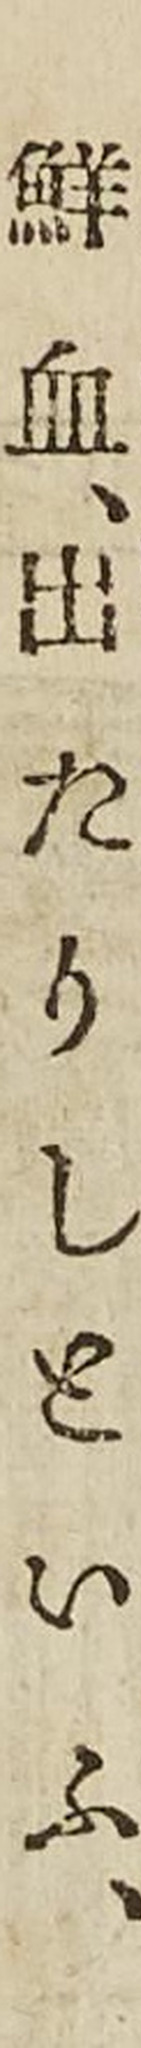鮮血、出たりしといふ、
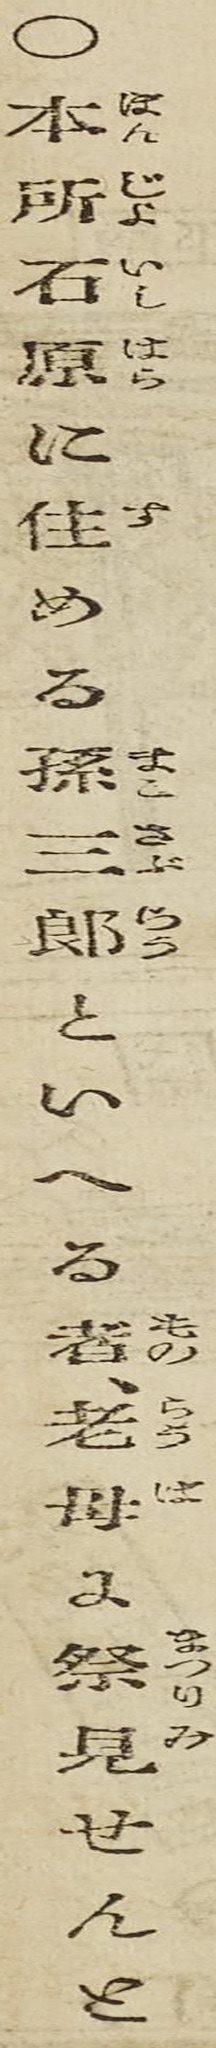○本所石原に住める孫三郎といへる者、老母に祭見せんと
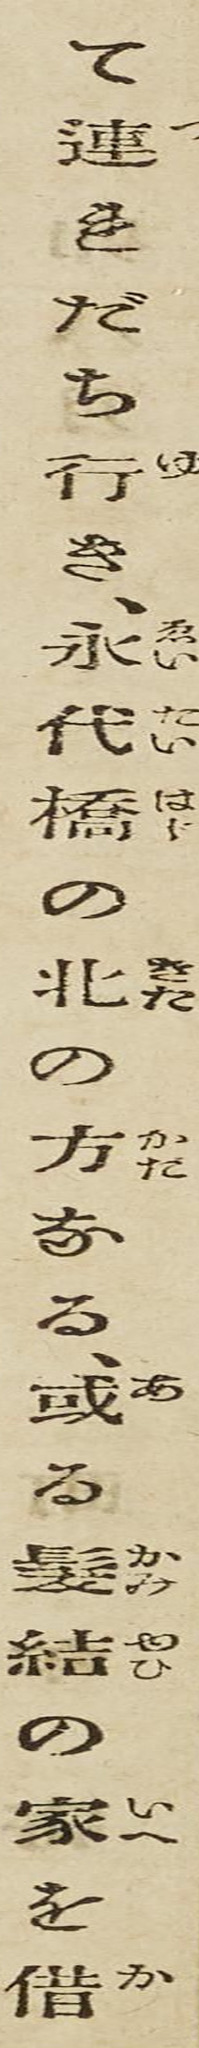て連れだち行き、永代橋の北の方なる、或る髪結の家を借
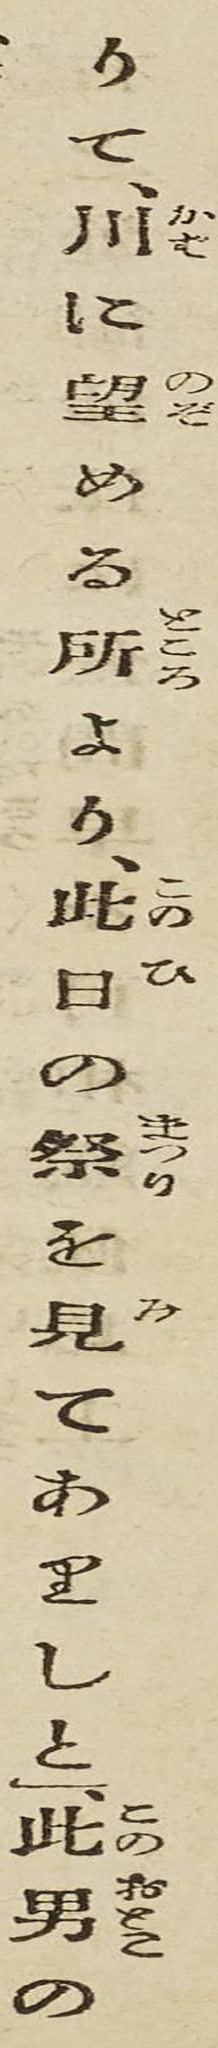りて、川に望める所より、此日の祭を見てありしと」、此男の
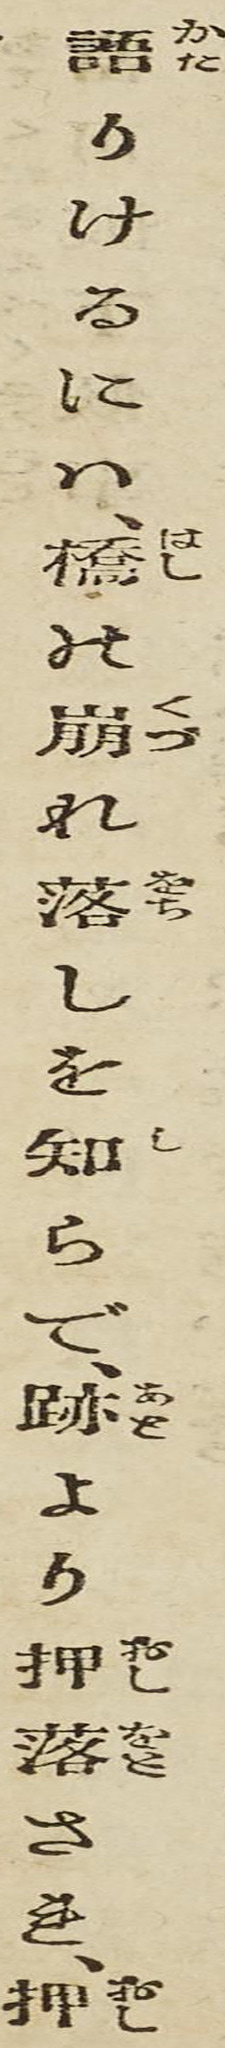語りけるには、橋の崩れ落しを知らで、跡より押落され、押
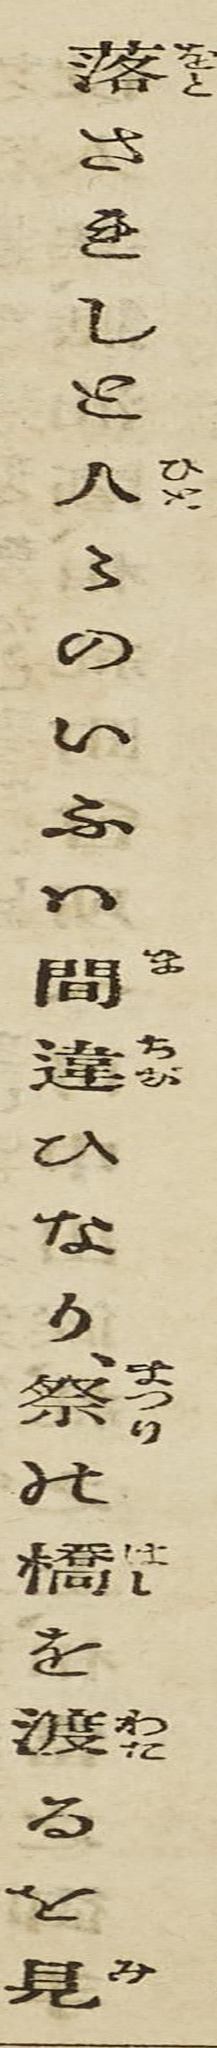落されしと人〻のいふは間違ひなり、祭の橋を渡るを見
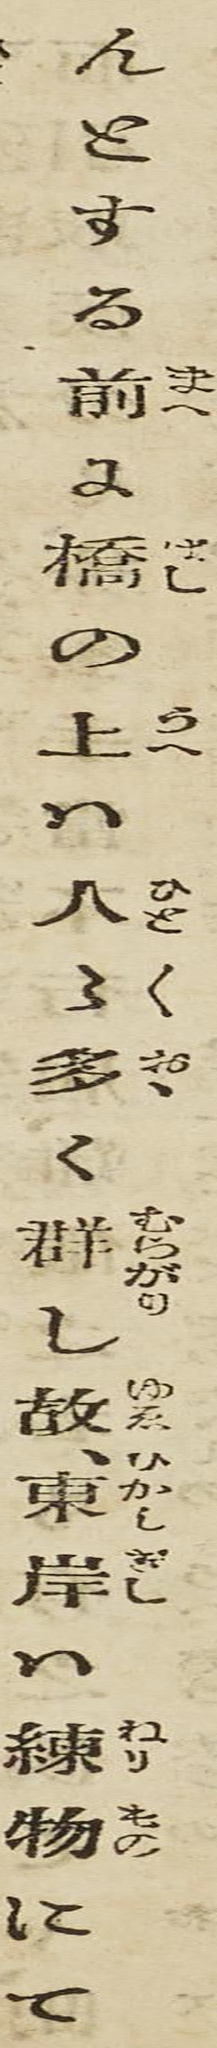んとする前に橋の上は人〻多く群し故、東岸は練物にて
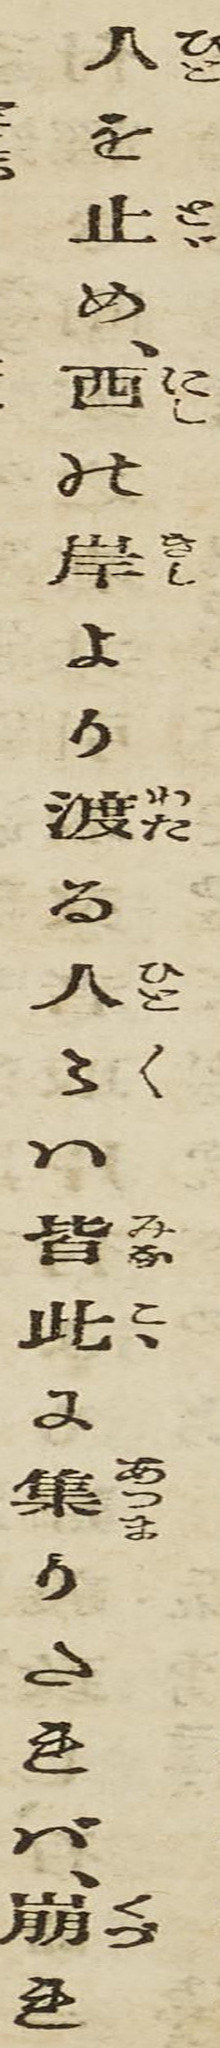人を止め、西の岸より渡る人〻は皆此に集りたれば崩れ
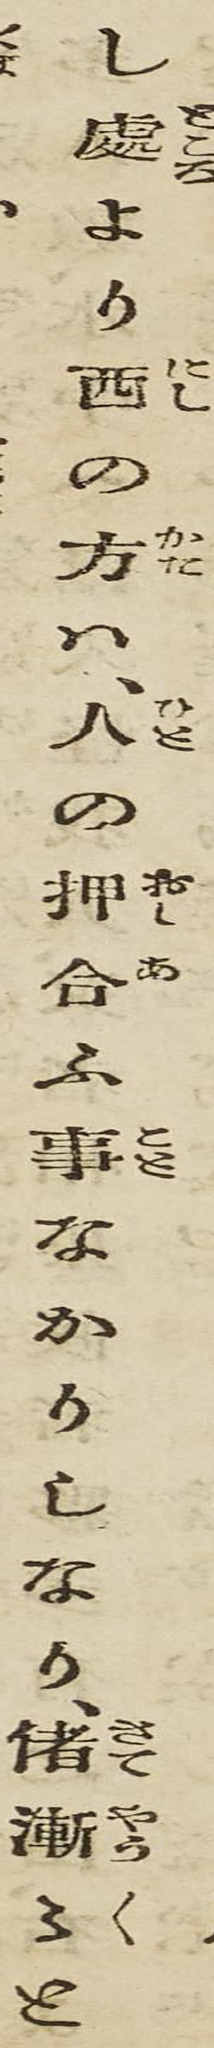し処より西の方は、人の押合ふ事なかりしなり、偖漸〻と
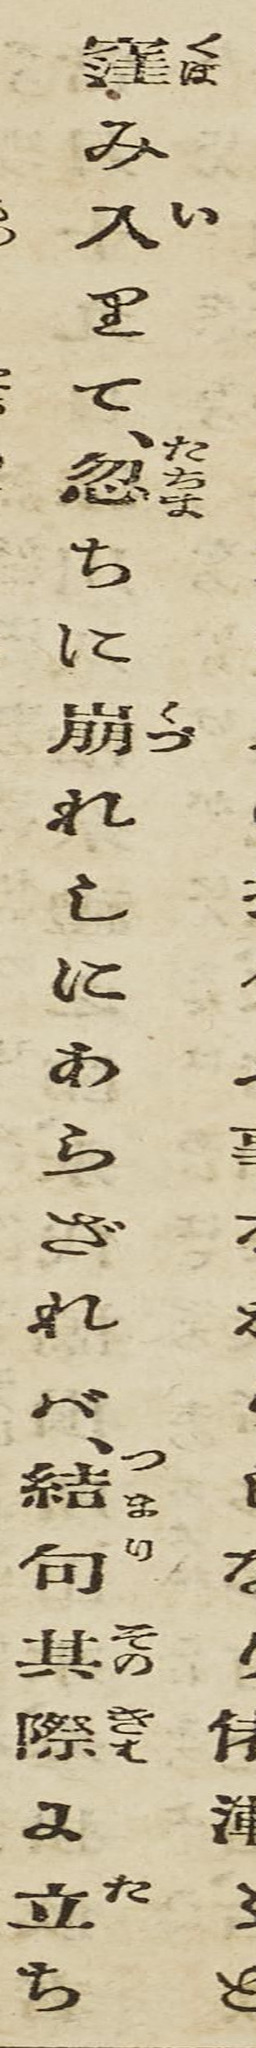窪み入りて、忽ちに崩れしにあらざれば、結句其際に立ち
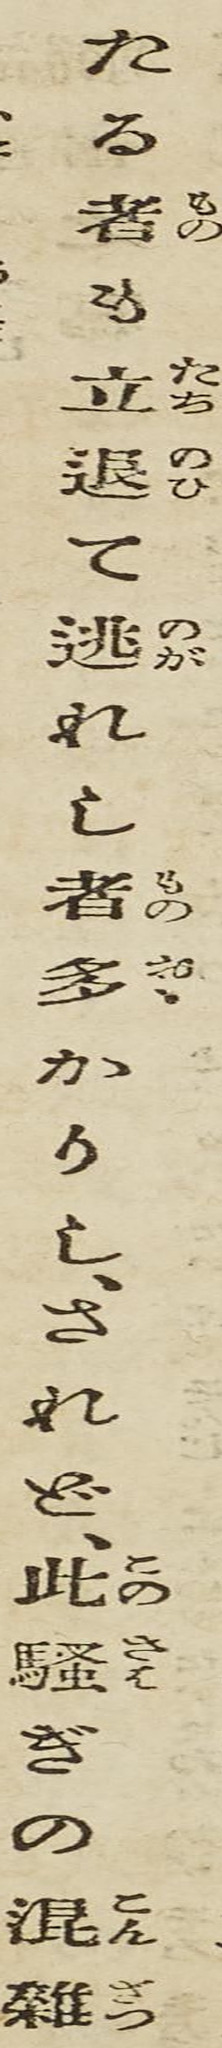たる者も立退て逃れし者多かりし、されど、此騒ぎの混雑
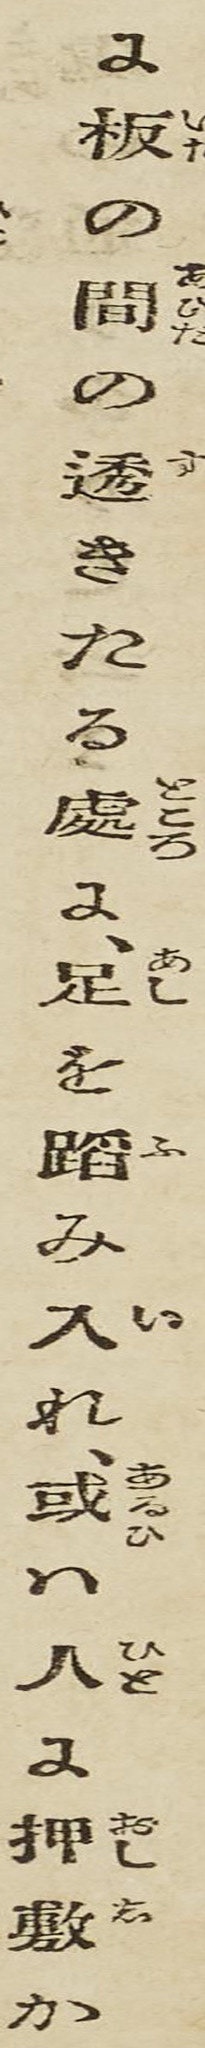に板の間の透きたる処に、足を踏み入れ、或は人に押敷か
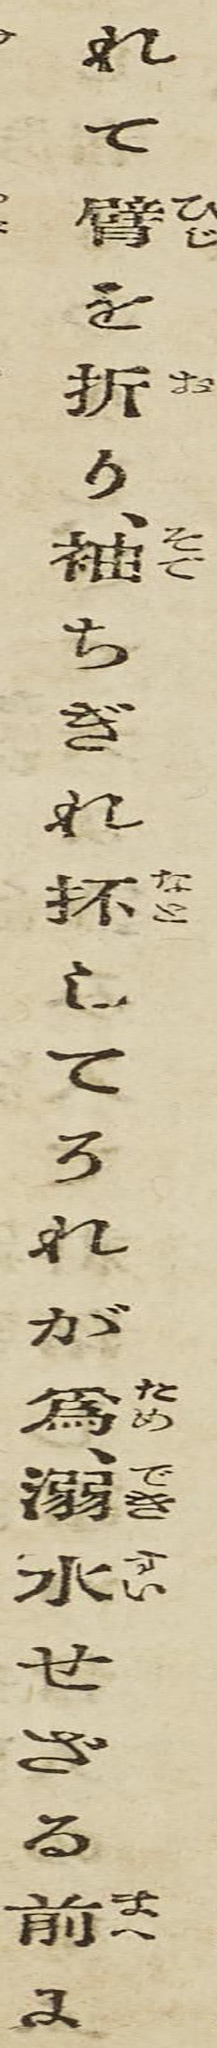れて臂を折り、袖ちぎれ抔してそれが為、溺水せざる前に
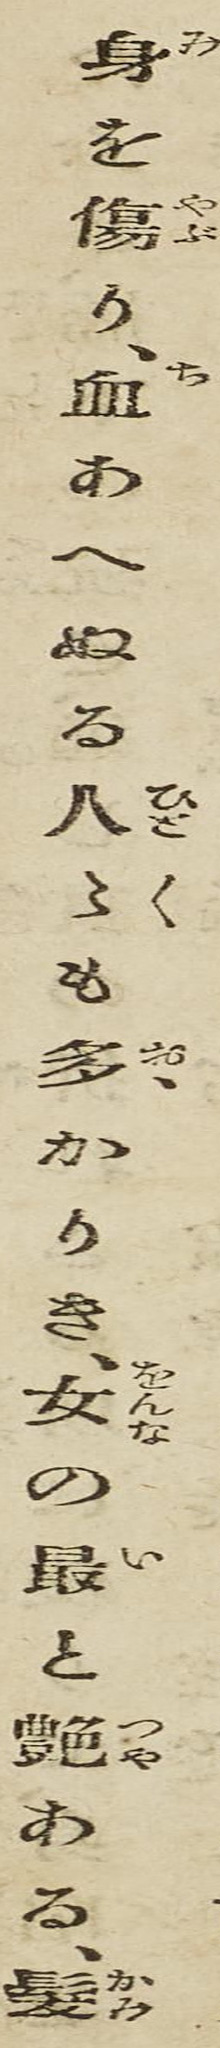身を傷り、血あへぬる人〻も多かりき、女の最と艶ある、髪

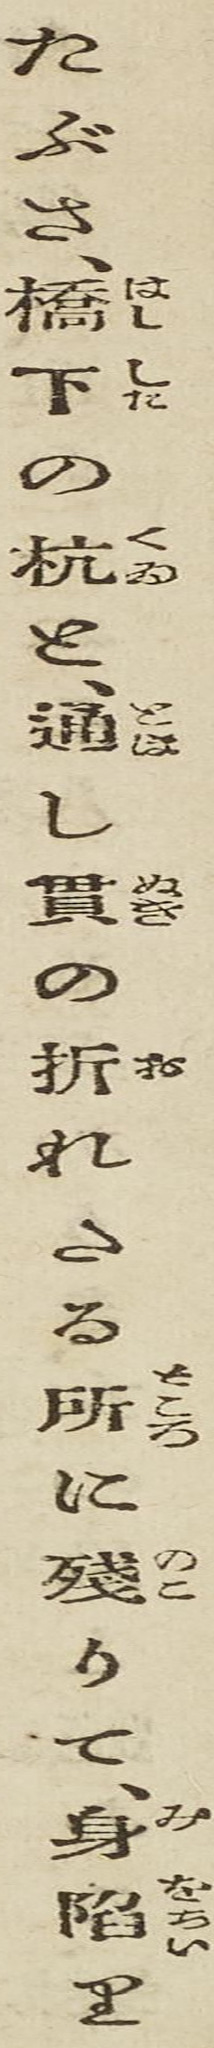たぶさ、橋下の杭と、通し貫の折れたる所に残りて身陥り
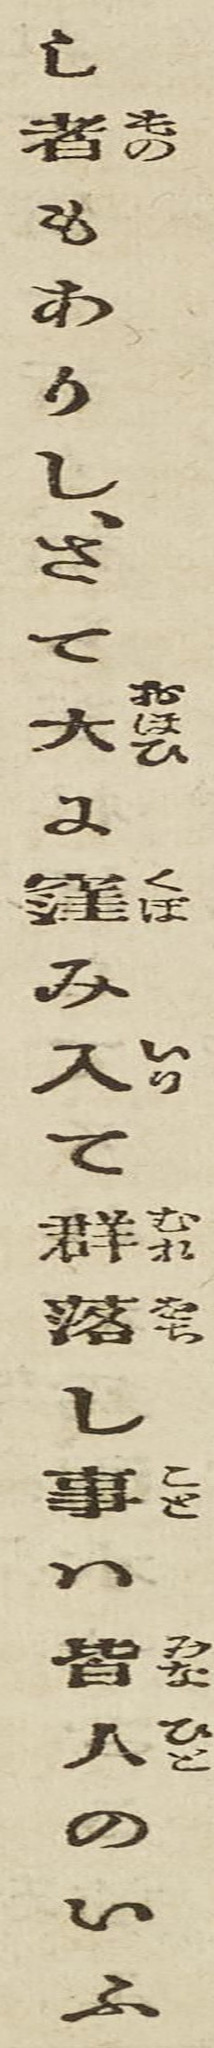し者もありし、さて大に窪み入て群落し事は皆人のいふ
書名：永代惨話　文化の夢　全
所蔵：東京大学地震研究所図書室 Earthquake Research Institute Library, The University of Tokyo, JAPAN
